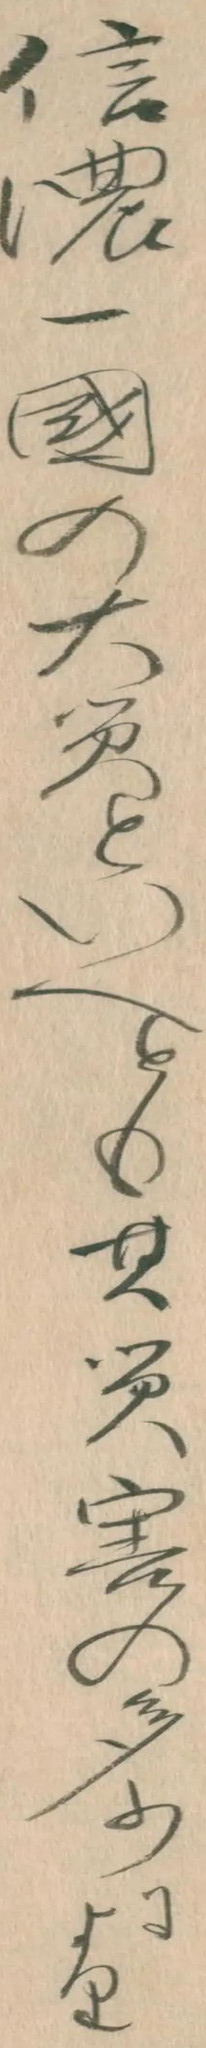信濃一国の大災といへとも其災害の多少により
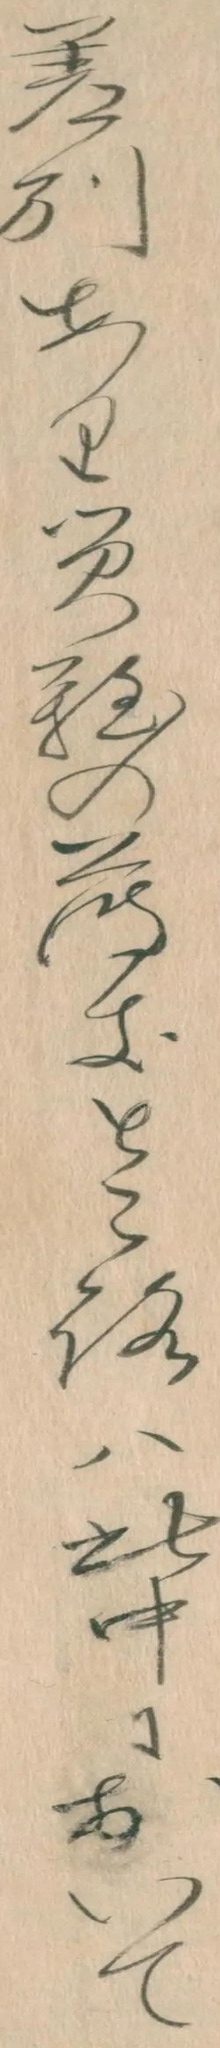差別あり災難の薄きところは此中において
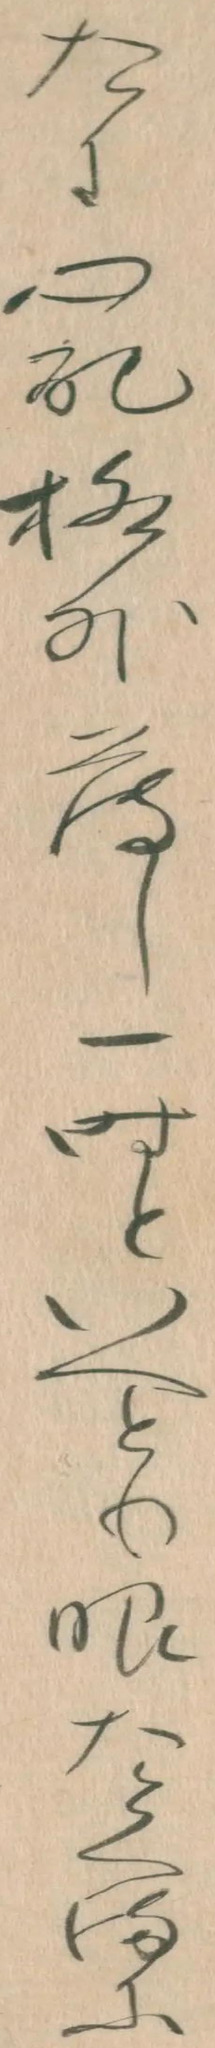たに心配格外薄し一時といへとも眼たくまに
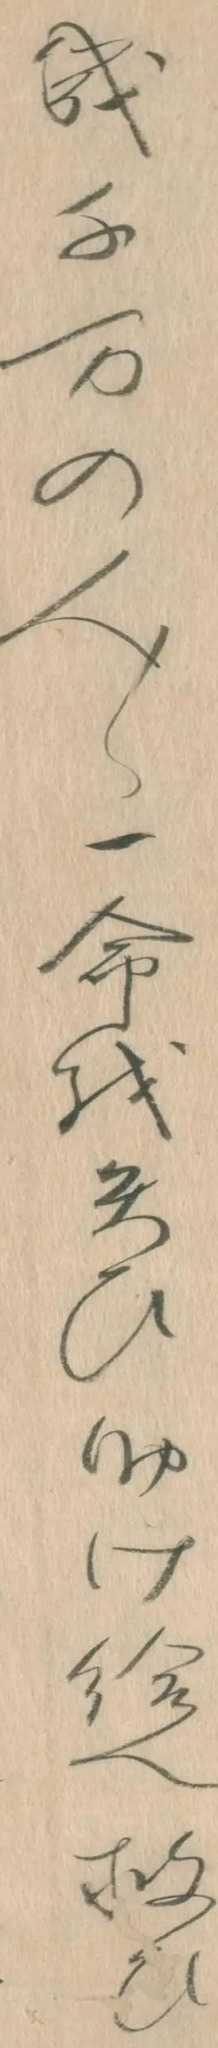我千万の人〳〵一命を失ひ助け給へ救ひ
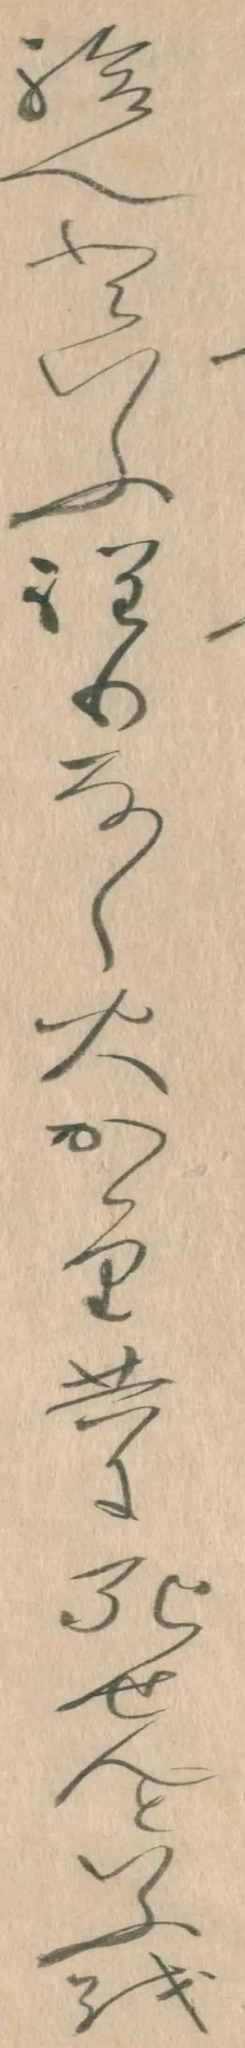給へといふ程もなく火かゝり共に死せんといふを
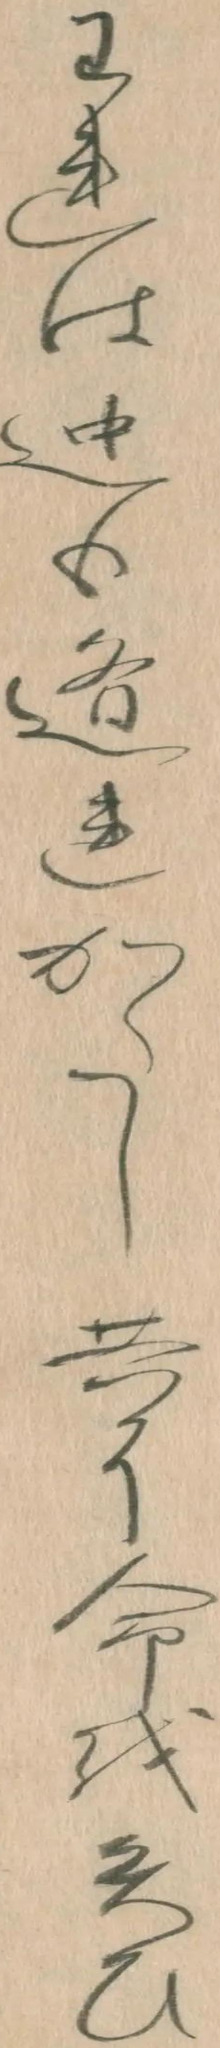われは迚も遁れかたし共に命を失ひ
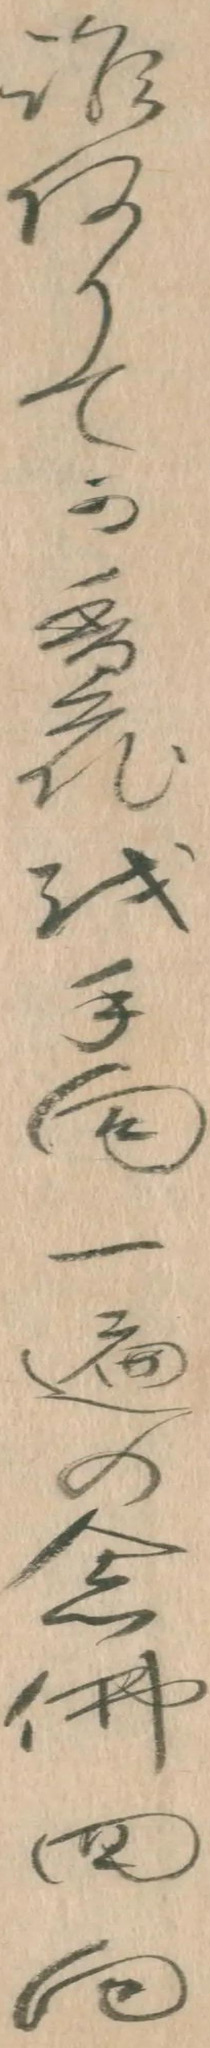誰ありてか香花を手向一遍の念仏回向
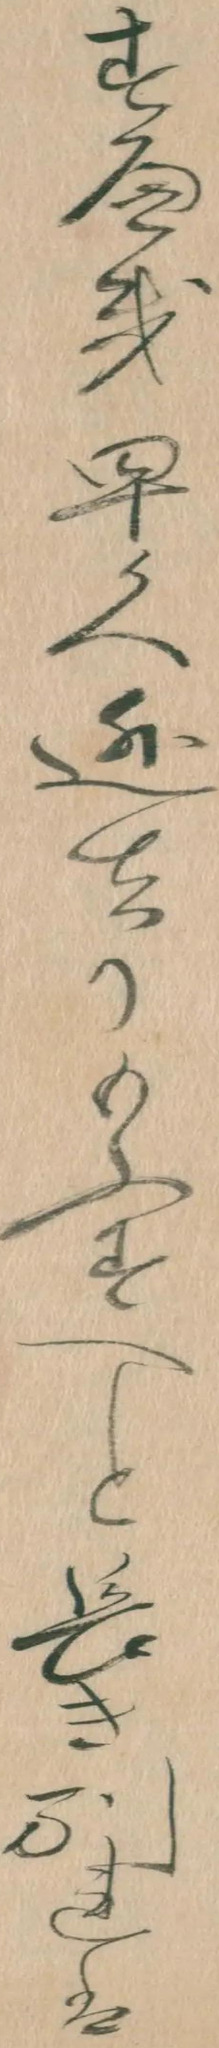すへき早く迯去りもふすへしと長き別れは
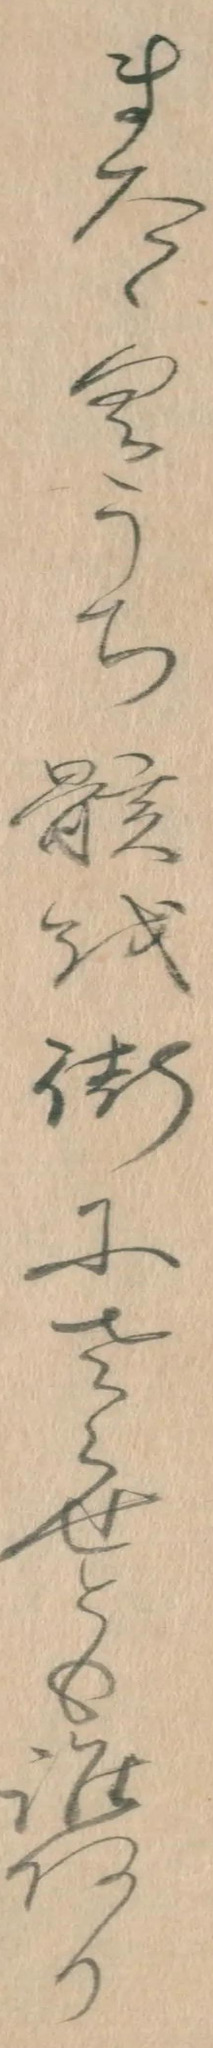またゝくうち骸を街にさらせとも誰あり
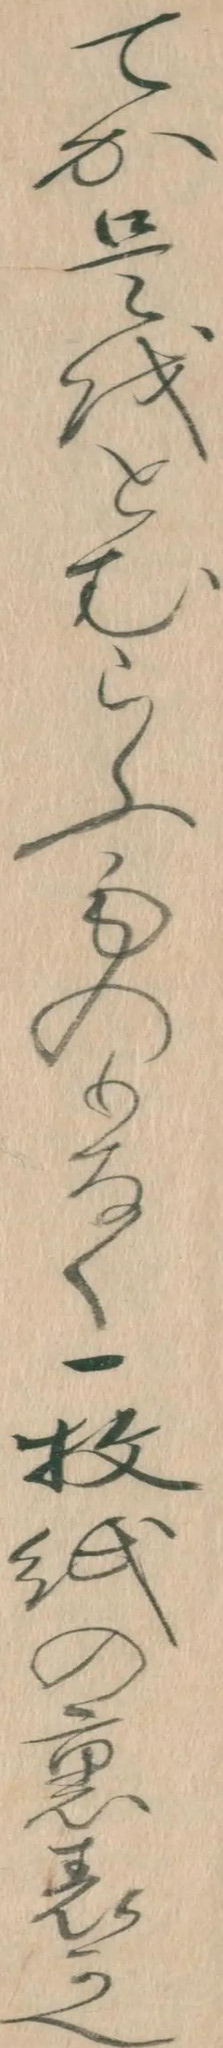てか是をとむらふものもなく一枚紙の裏表かへ
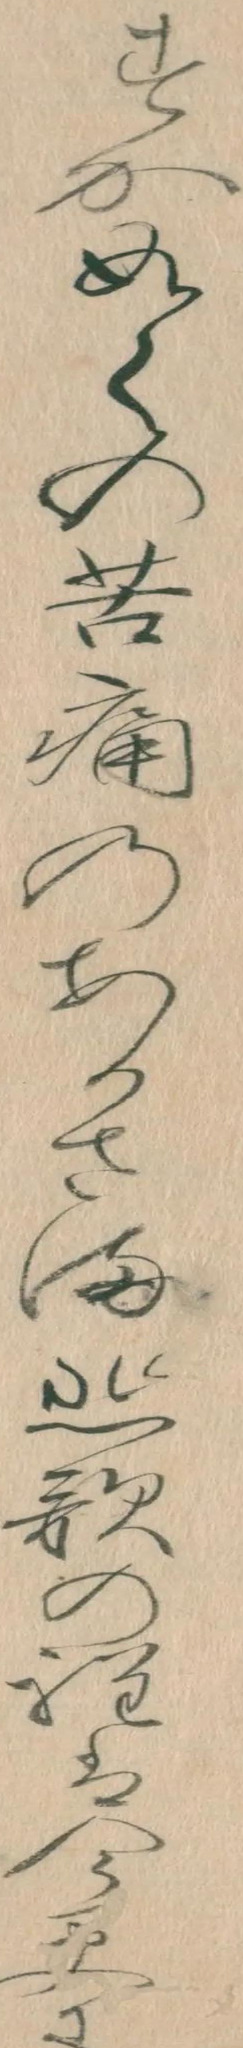すか如くの苦痛のありさま悲歎の程は今更に
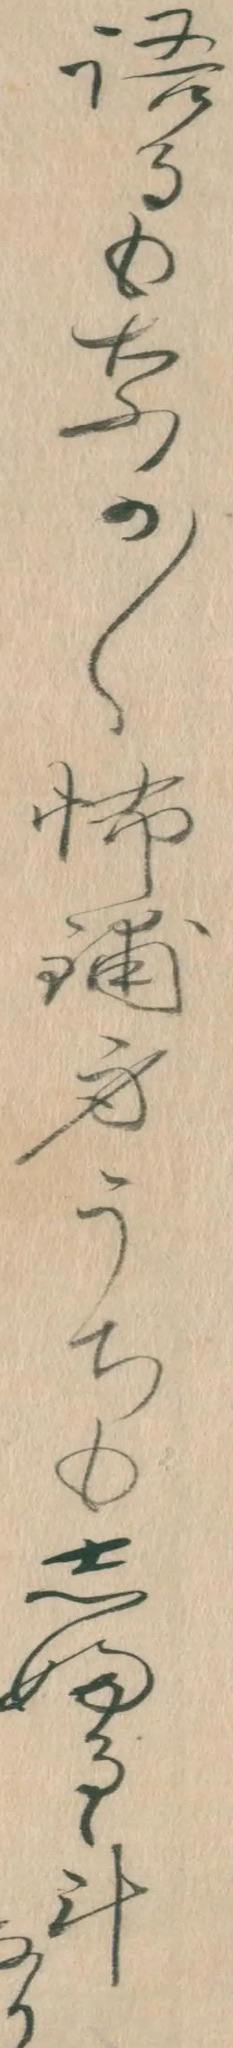語るもなか〳〵怖鋪身うちもしふるゝ計なり
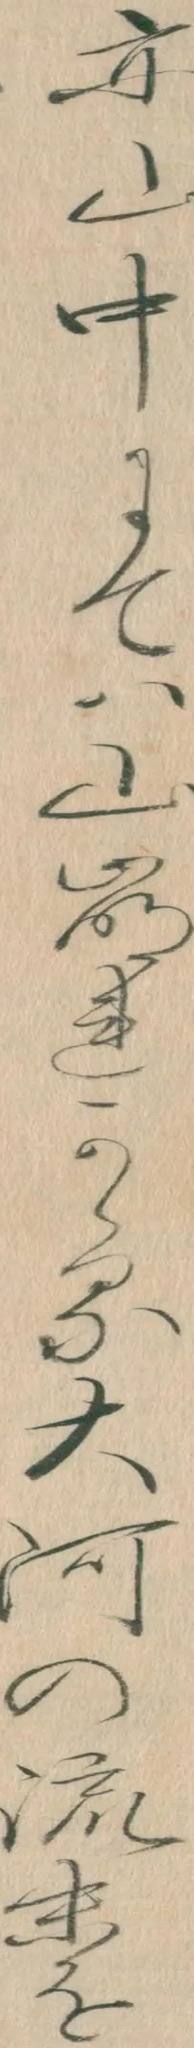亦山中にては山崩れかゝる大河の流末を
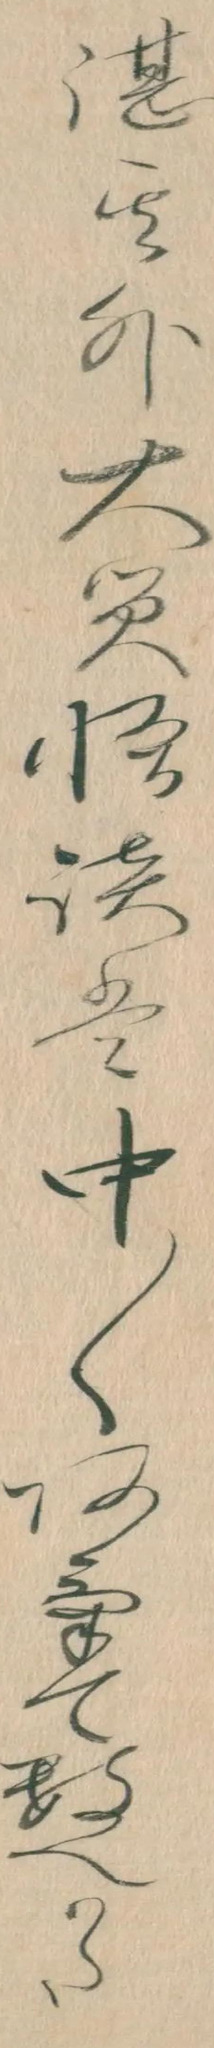湛其外大災怪談は中〳〵あけて数へかたし
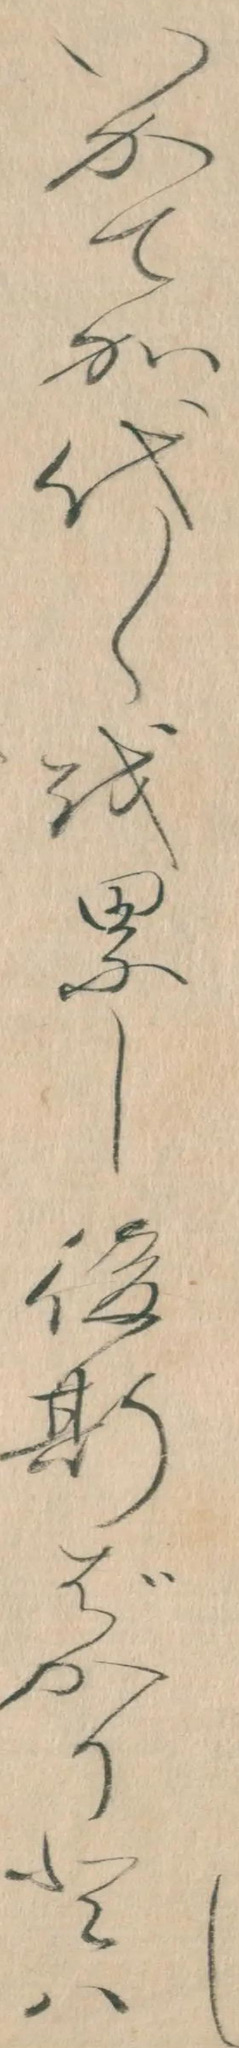いかてか代〳〵を累し後斯ばかりとは
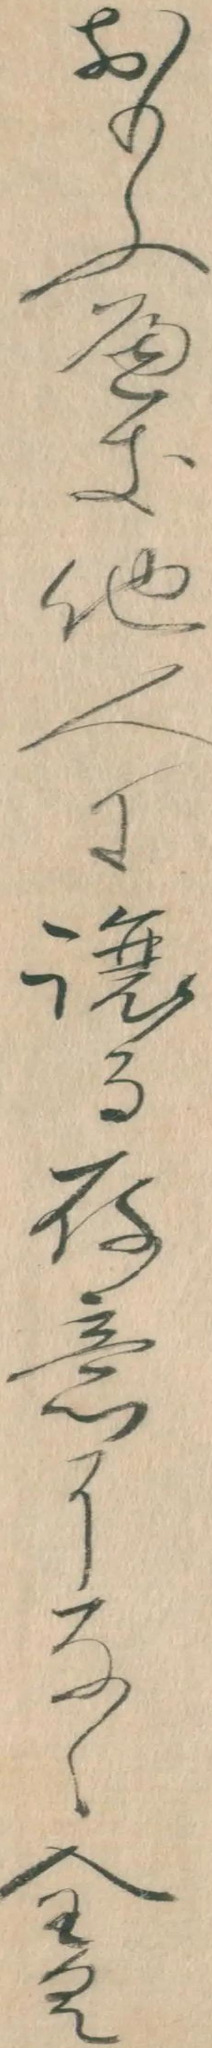おもふへき他人に譲る存意になく全く
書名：俗語之種. [4]
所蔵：国立国会図書館 National Diet Library, JAPAN
